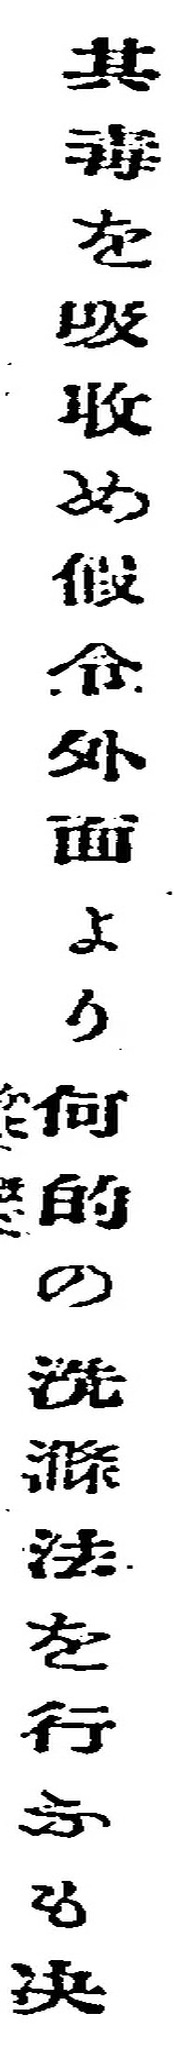其毒を吸収め仮令外面より何的の洗滌法を行ふも決
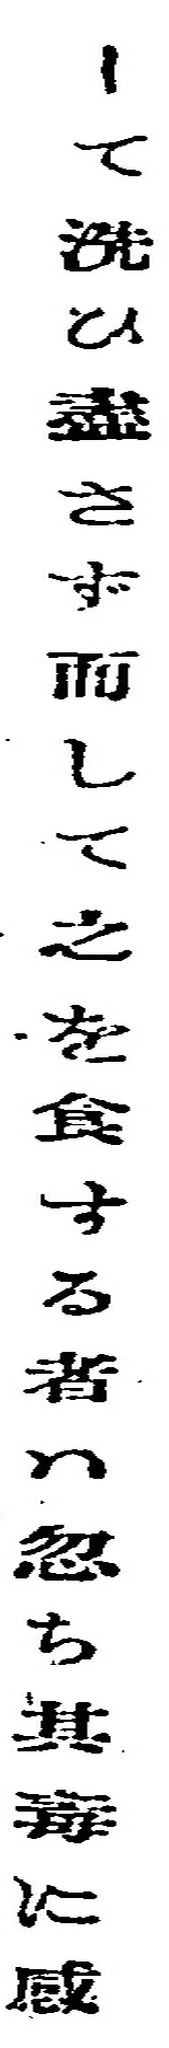して洗ひ尽さず而して之を食する者は忽ち其毒に感
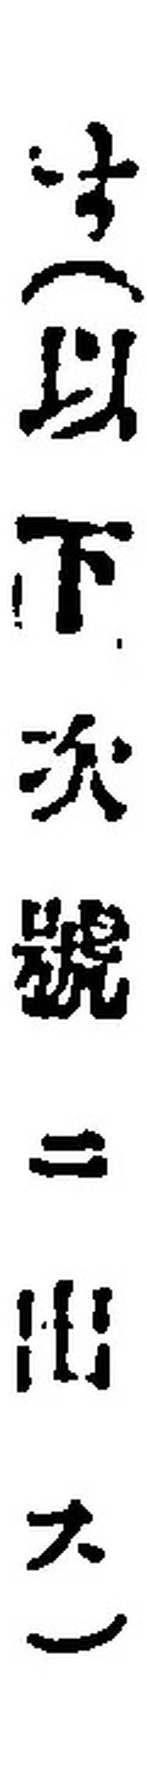す(以下次号ニ出ス)
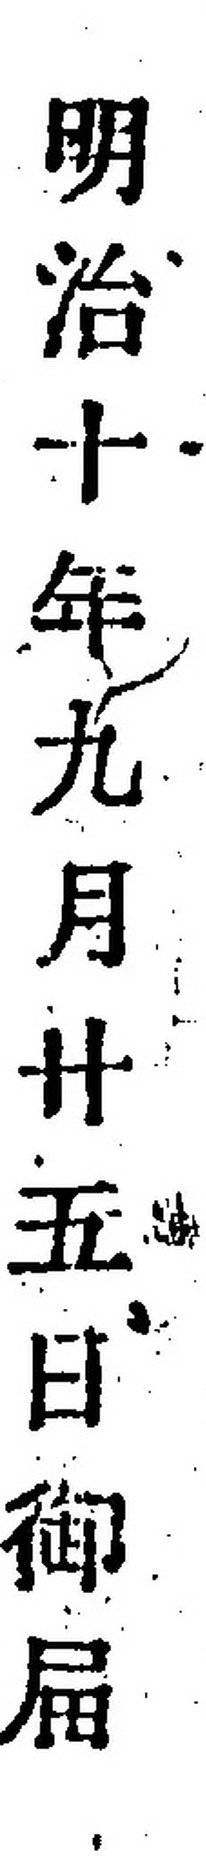明治十年九月廿五日御届
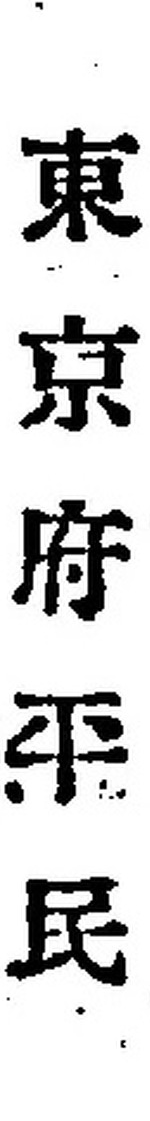東京府平民
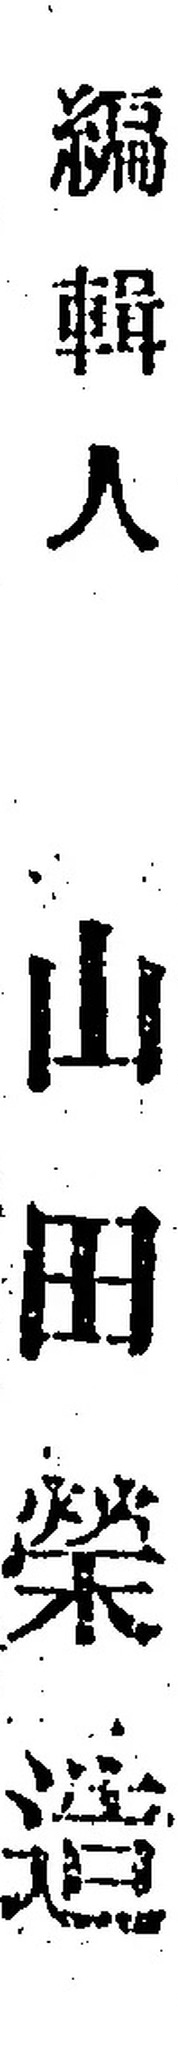編輯人山田栄造
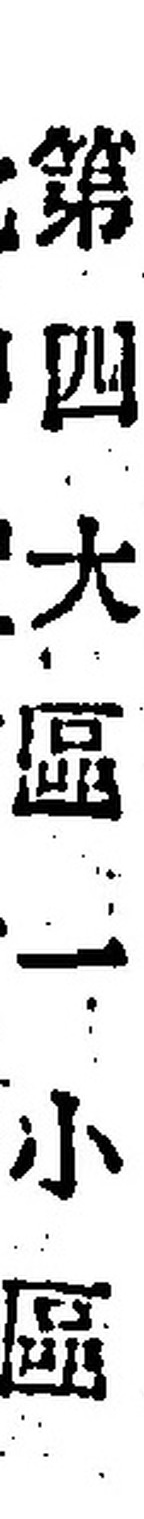第四大区一小区
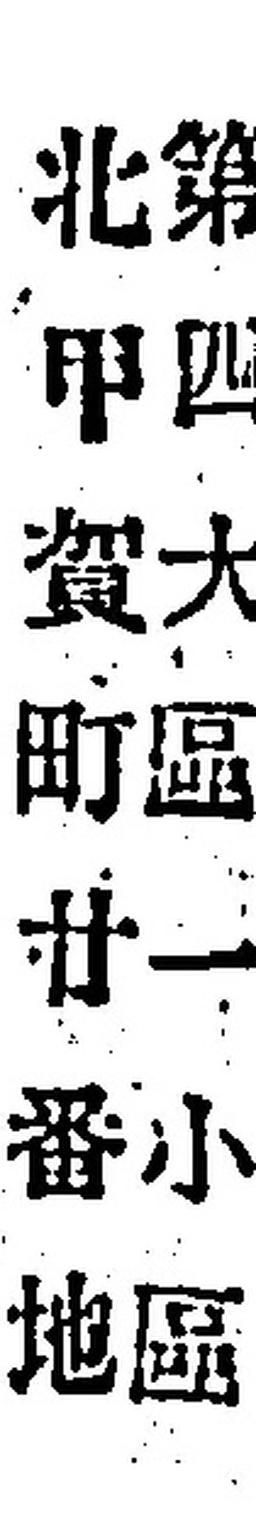北甲賀町廿番地
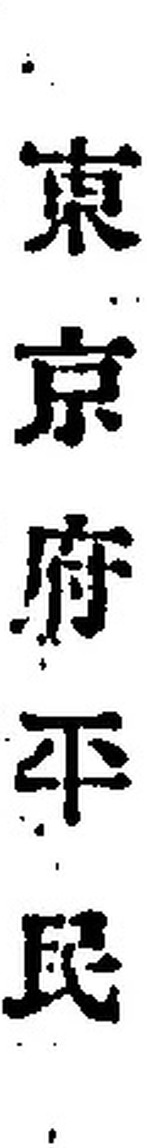東京府平民
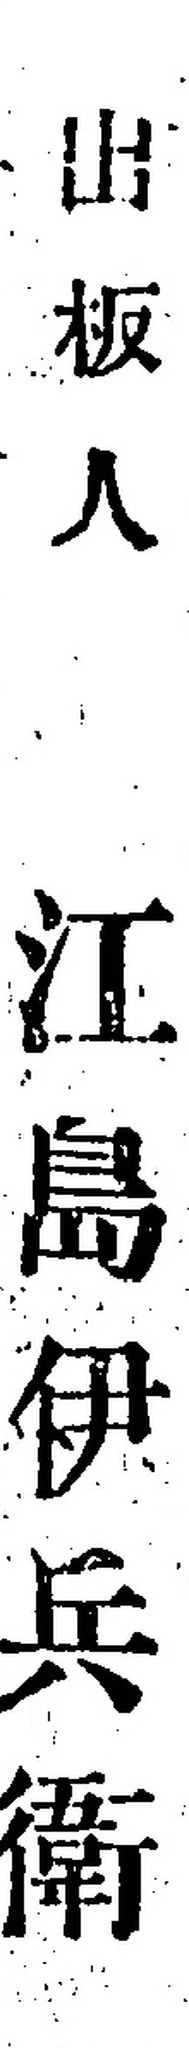出版人江島伊兵衛
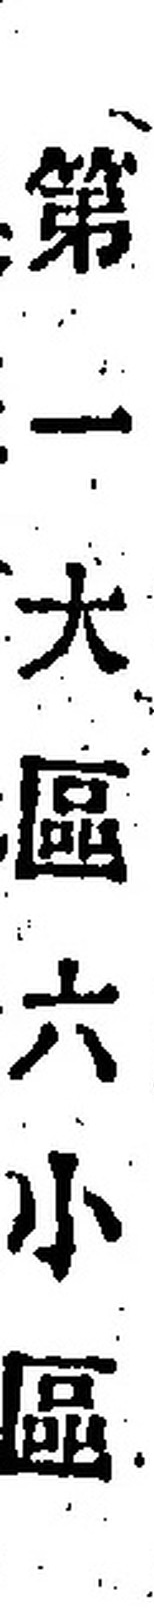第一大区六小区
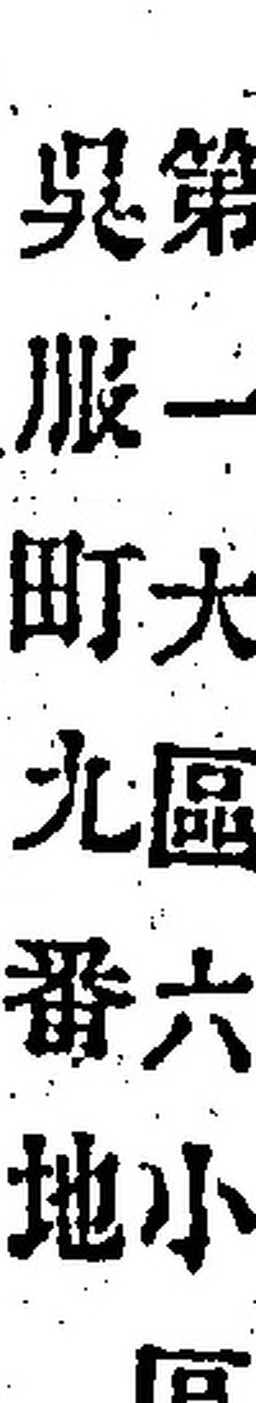呉服町九番地
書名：これら病予防心得
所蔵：国立国会図書館 National Diet Library, JAPAN
